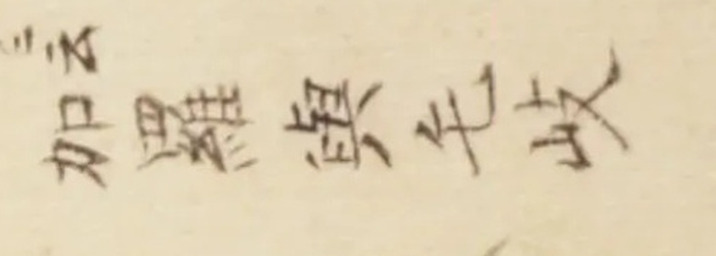加羅与毛岐
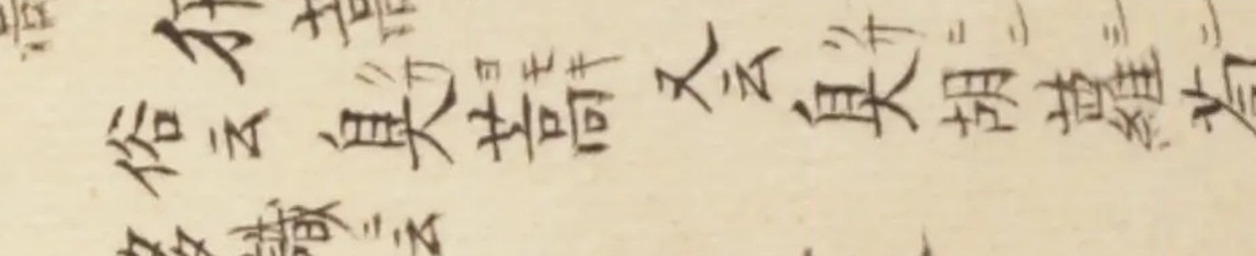俗云臭蒿又云臭胡蘿蔔
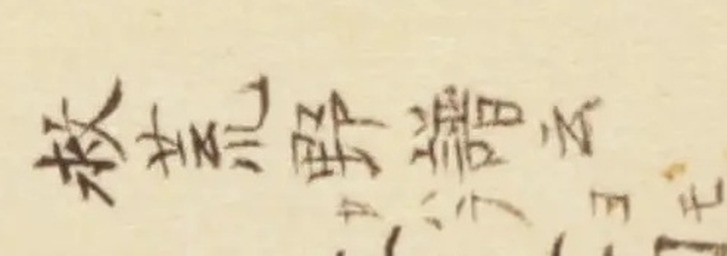救荒野譜云
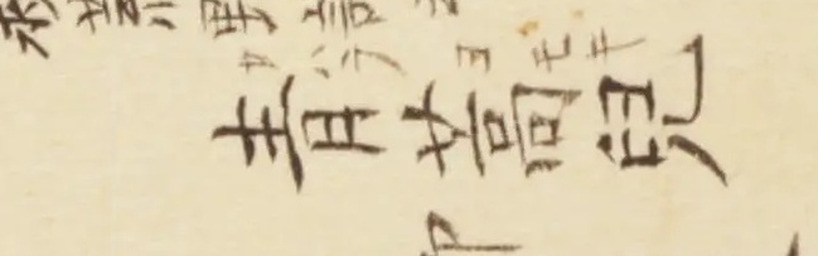青蒿児
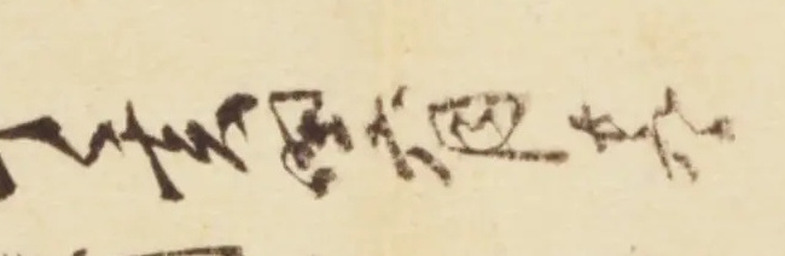丁亥閏六月廿六日
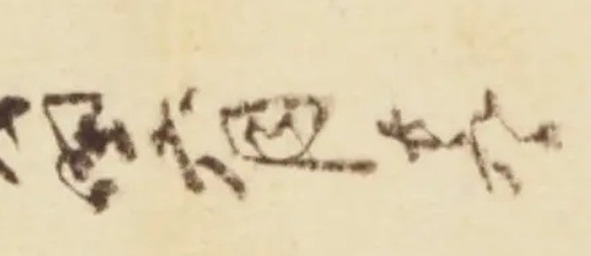丁亥閏六月廿六日
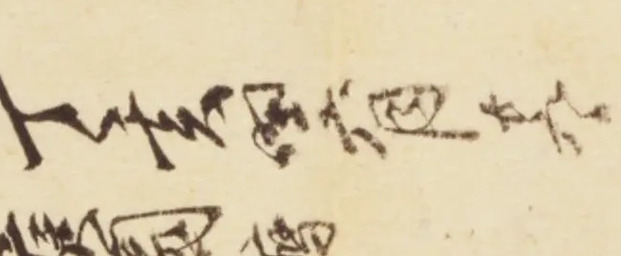丁亥閏六月廿六日
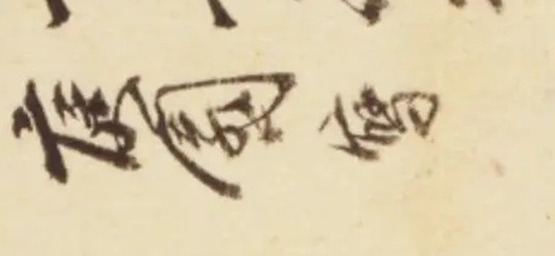庭園写

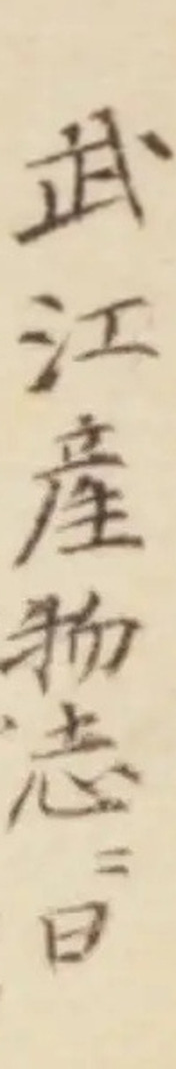武江産物志曰
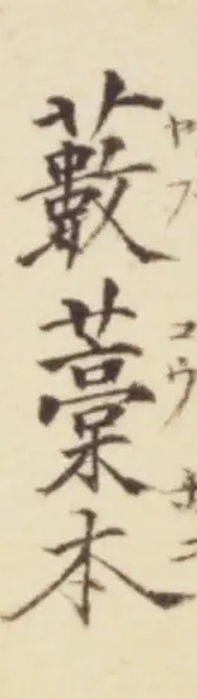薮藁本

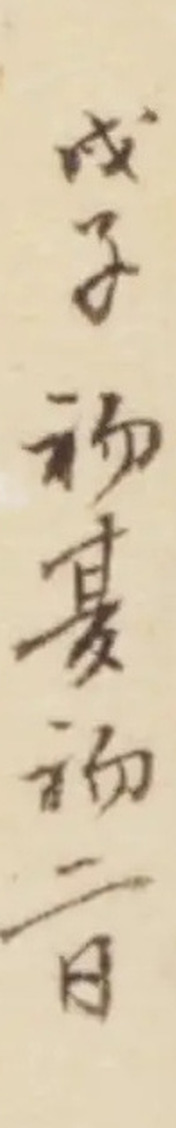戊子初夏初二日
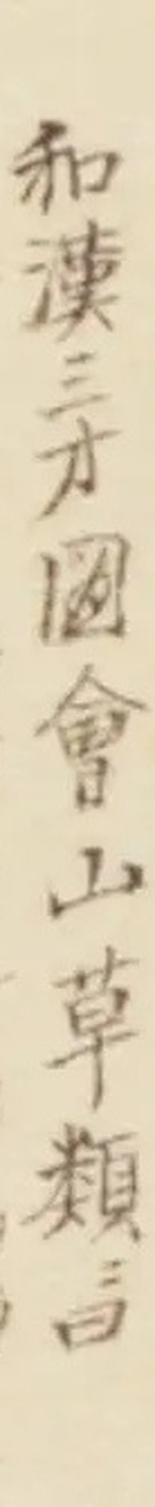和漢三才図会山草類曰
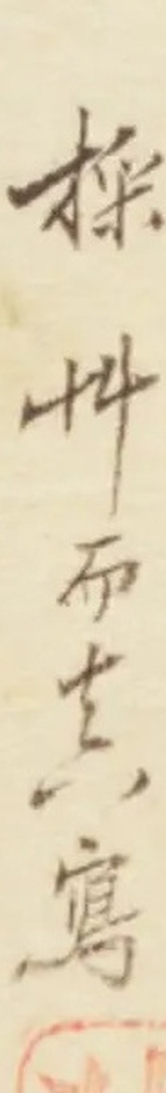採艸而真写
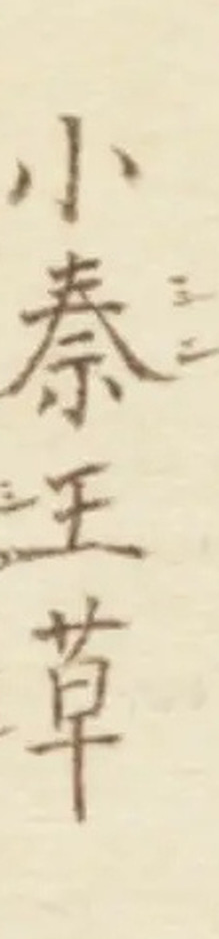小秦王草

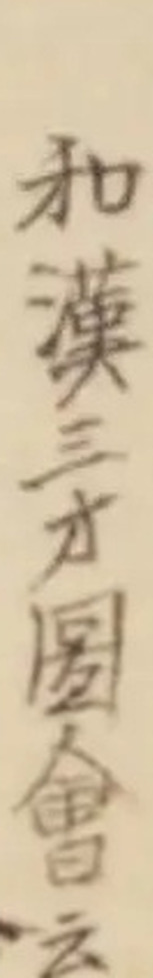和漢三才図会云
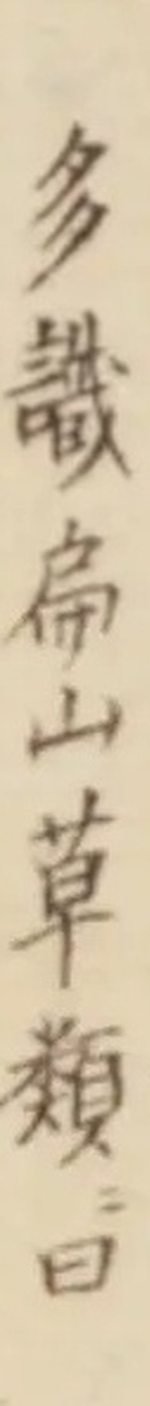多職扁山草類曰
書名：梅園草木花譜夏之部. 4
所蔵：国立国会図書館 National Diet Library, JAPAN
